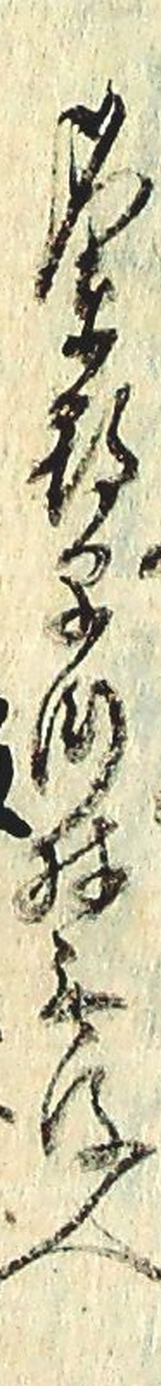名東郡早淵村無役人
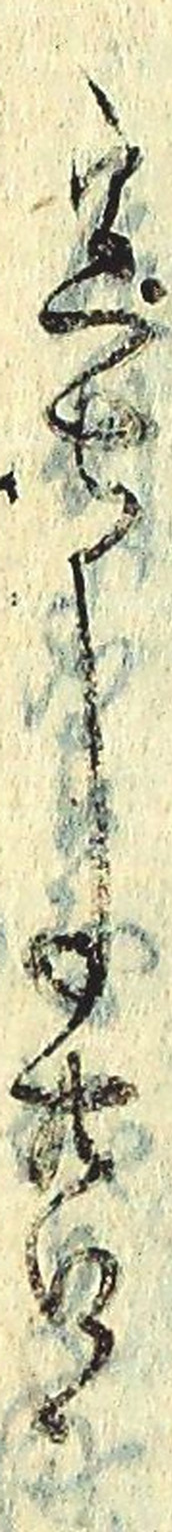寅年七月廿四日
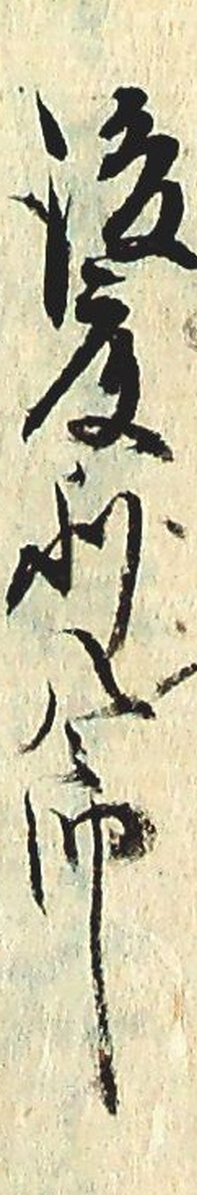後藤利八郎
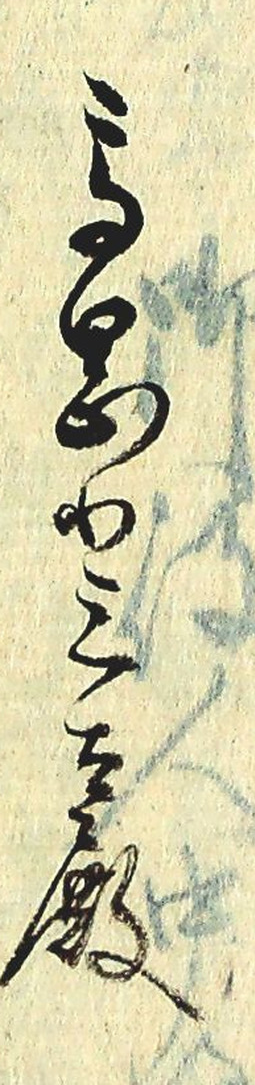高岡小三太殿
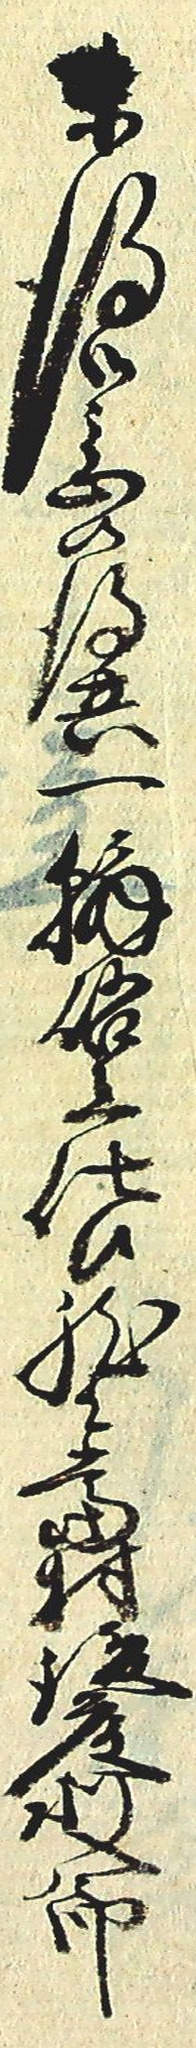未得御意候得共一翰啓上仕候然は当村後藤利八郎
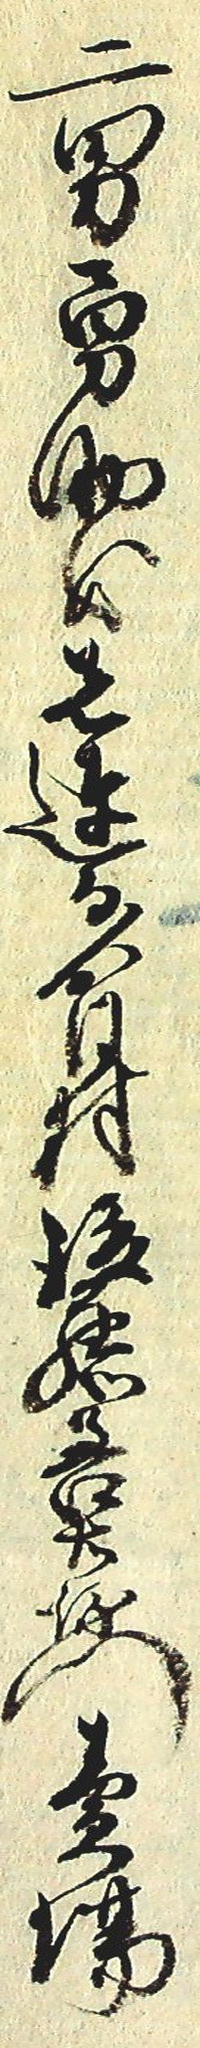二男勇助義先達てゟ同村後藤善右衛門売場
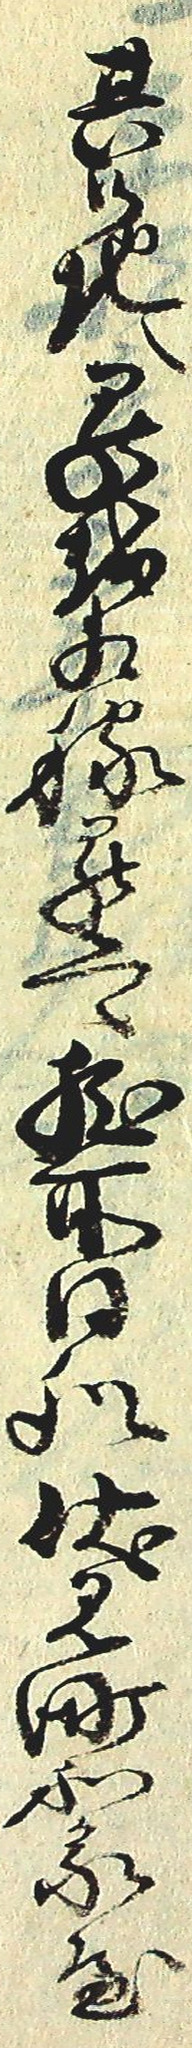其御地へ罷越相稼罷有候然所同処伏見町和泉屋
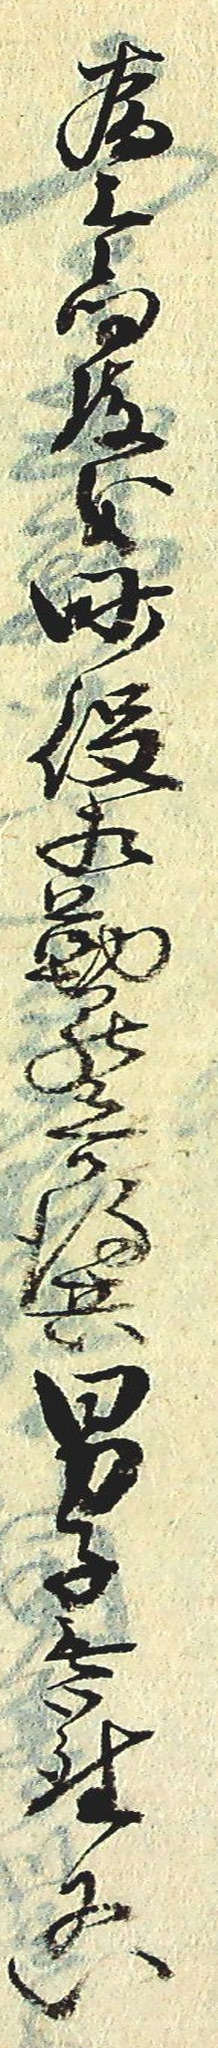為三郎殿義町役相勤罷有候得共男子無御座右
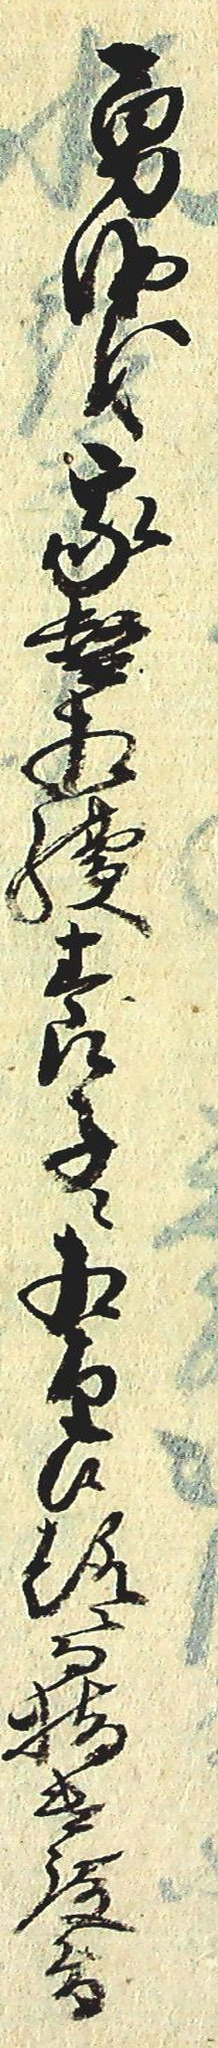勇助義家督相続養子に相望候趣にて指遣度旨
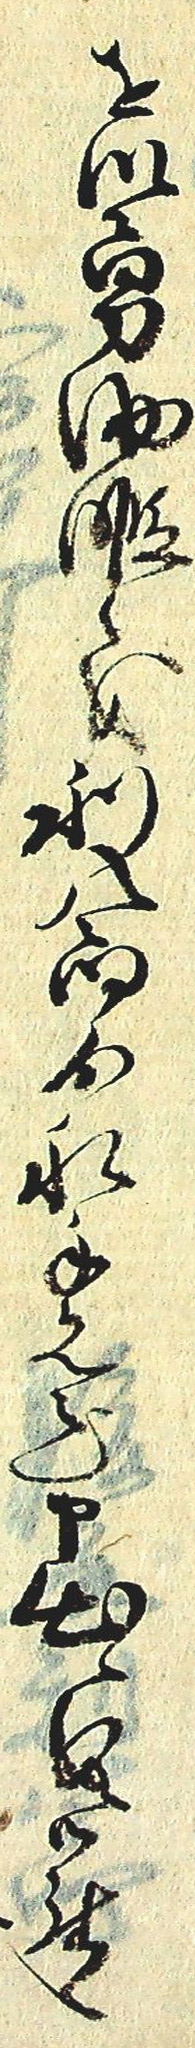を以勇助暇之義利八郎ゟ私手元迄申出候義御座候
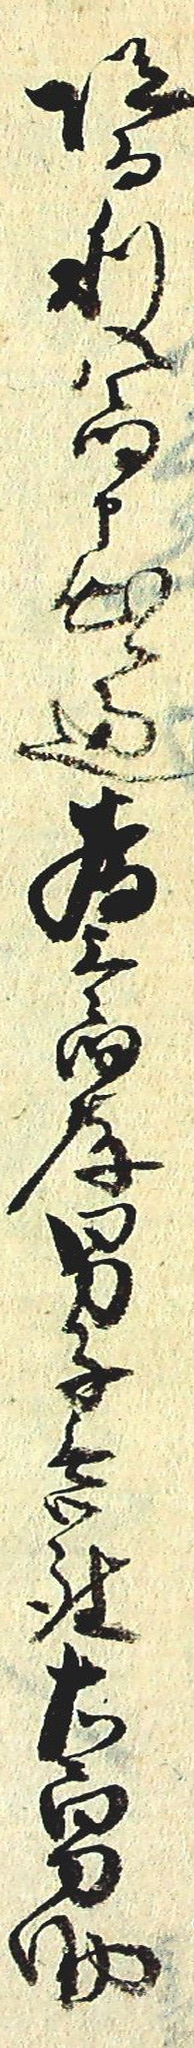随て利八郎申出候通為三郎殿男子無御座右勇助
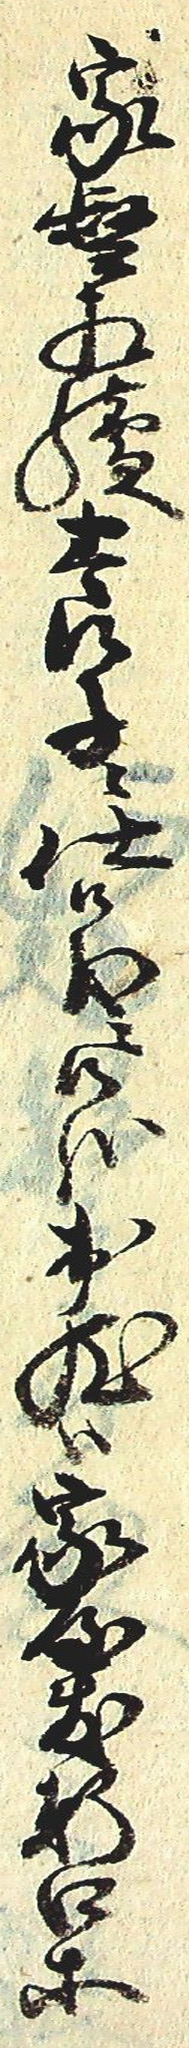家督相続養子に仕候義に候哉於然は家屋敷軒口等
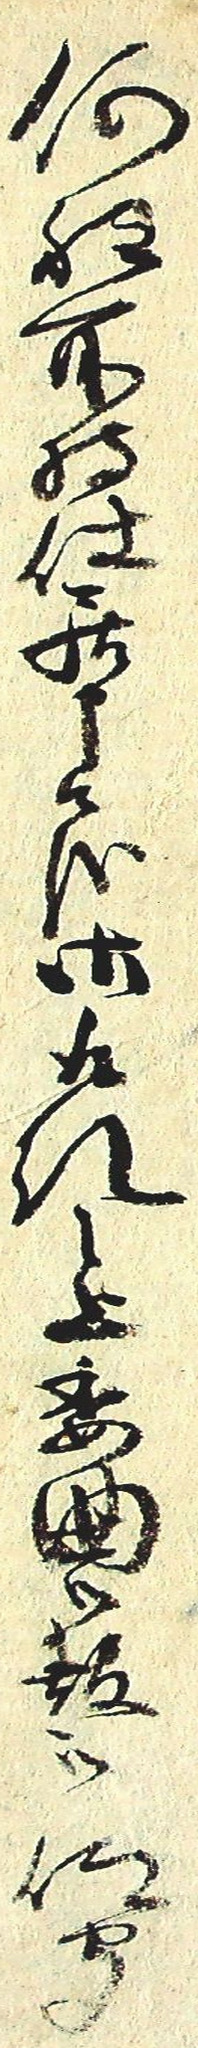何程所持仕居申候哉御取糺之上委細御報被仰聞
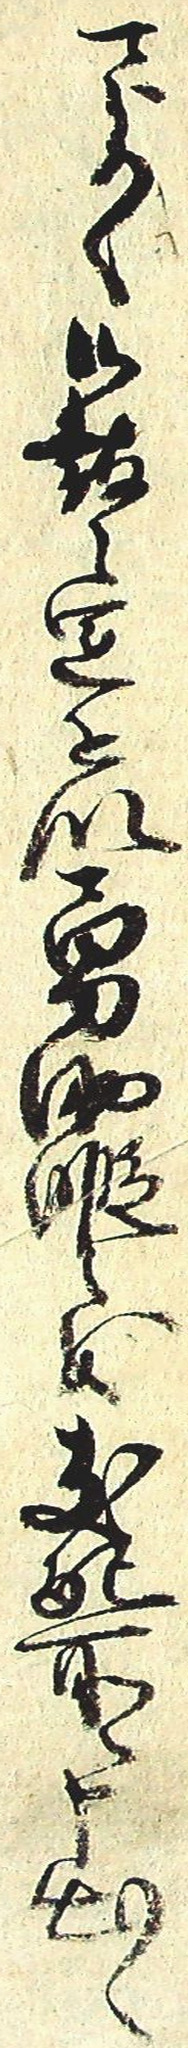可被下候御報之運を以勇助暇之義支配所へ申出候

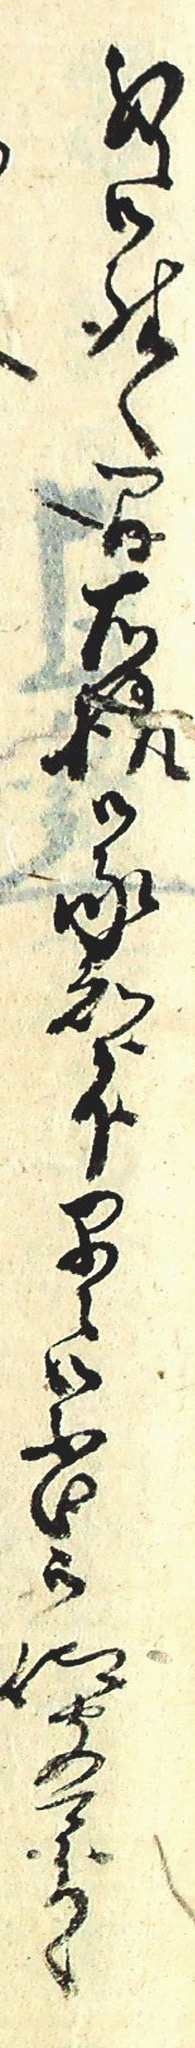義に御座候間右様御承知被下早々御否被仰聞可被下候
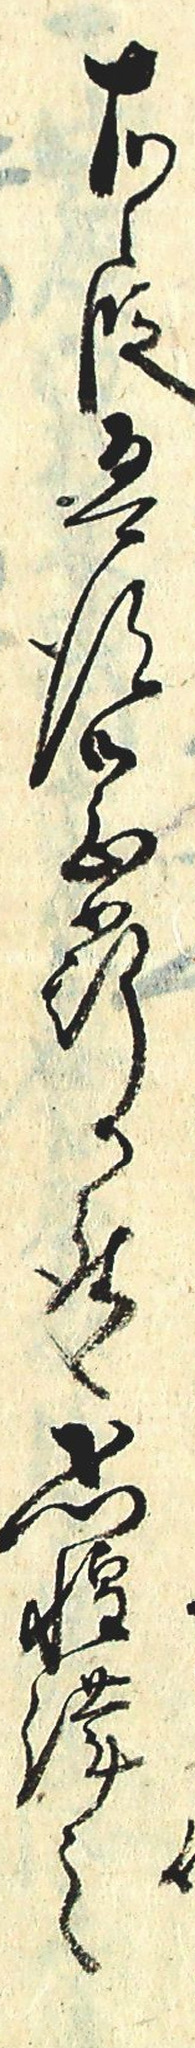右之段為可得御意如斯御座候恐惶謹言
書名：諸御願書控(弐番）
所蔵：鳴門教育大学 Naruto University of Education
